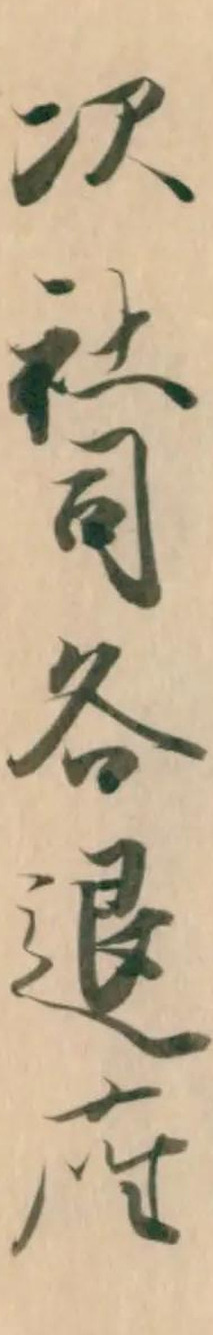次社司各退座
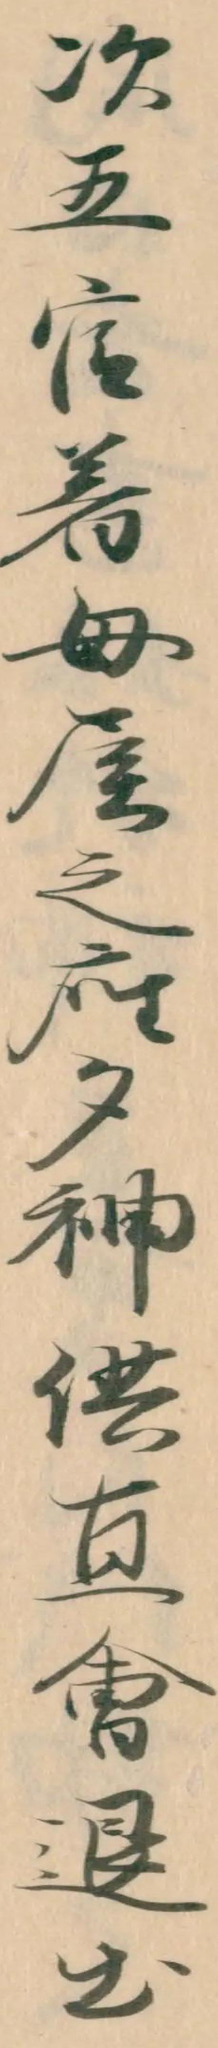次五官着母屋之座夕神供直会退出
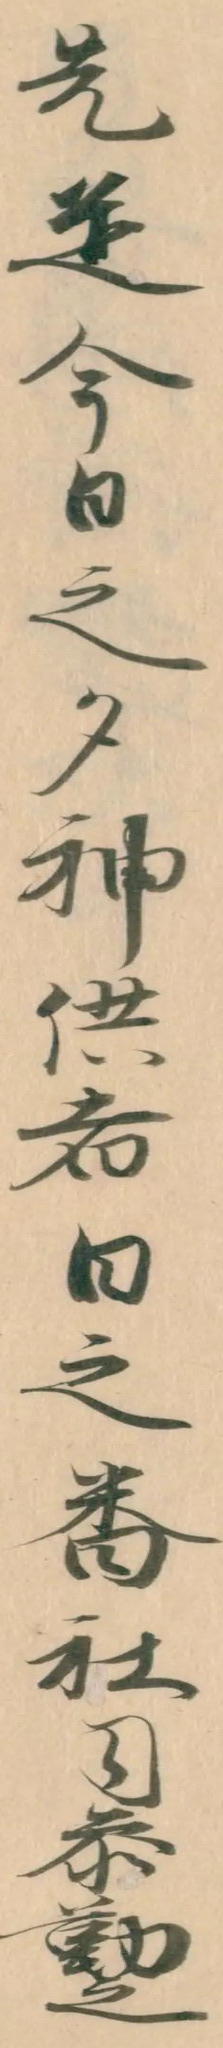先是今日之夕神供は日之番社司参勤之
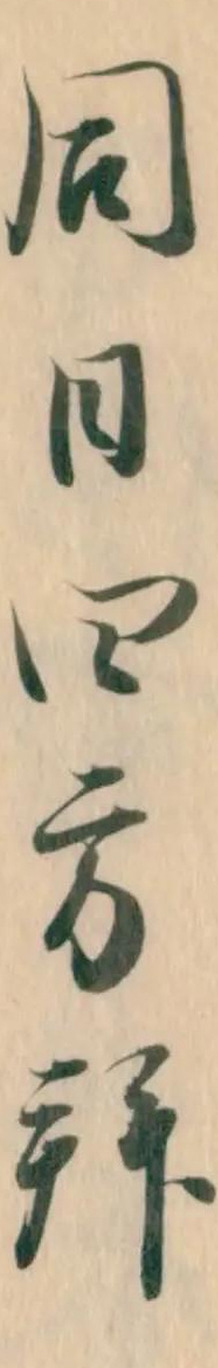同日四方拝
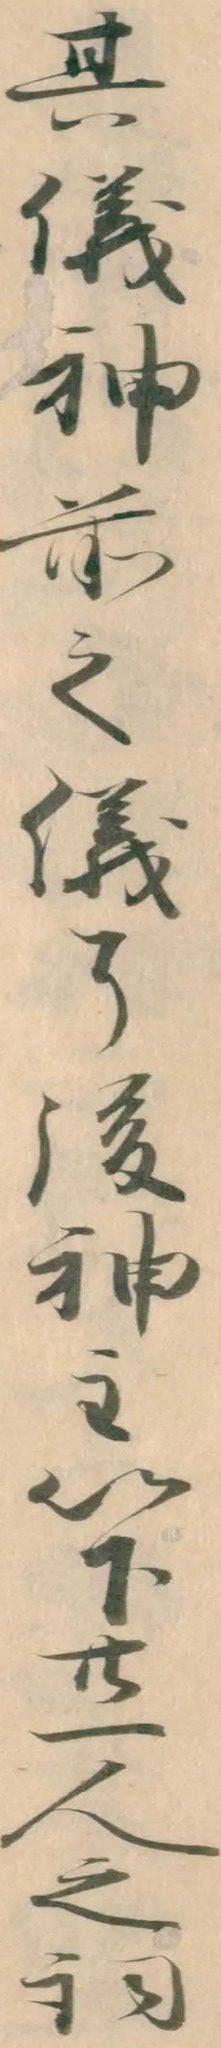其儀神前之儀に後神主以下共一人之詞
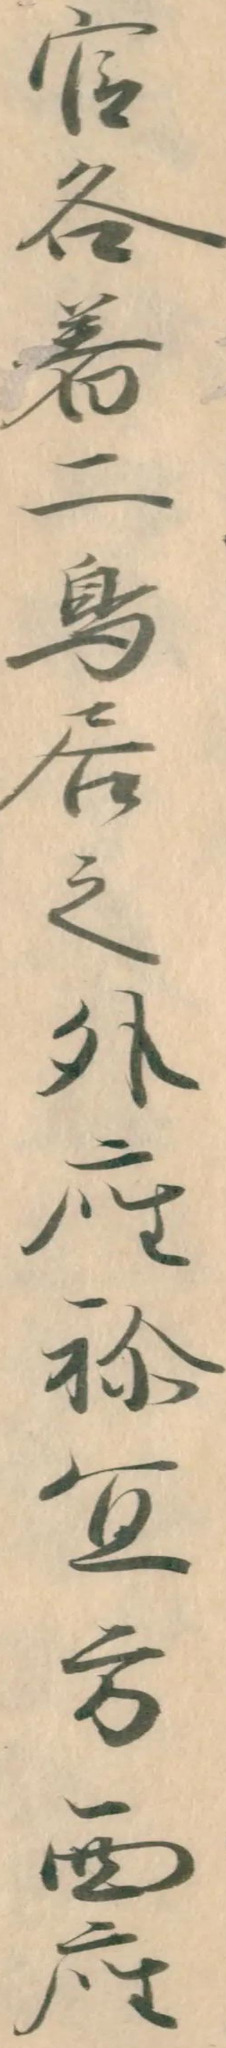官各着二鳥居之外座禰宜方西座
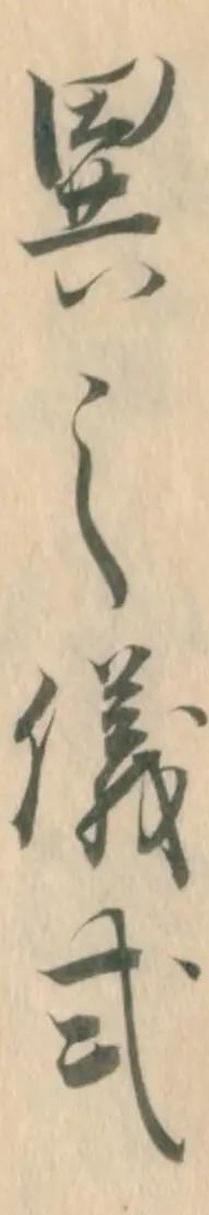異之儀式
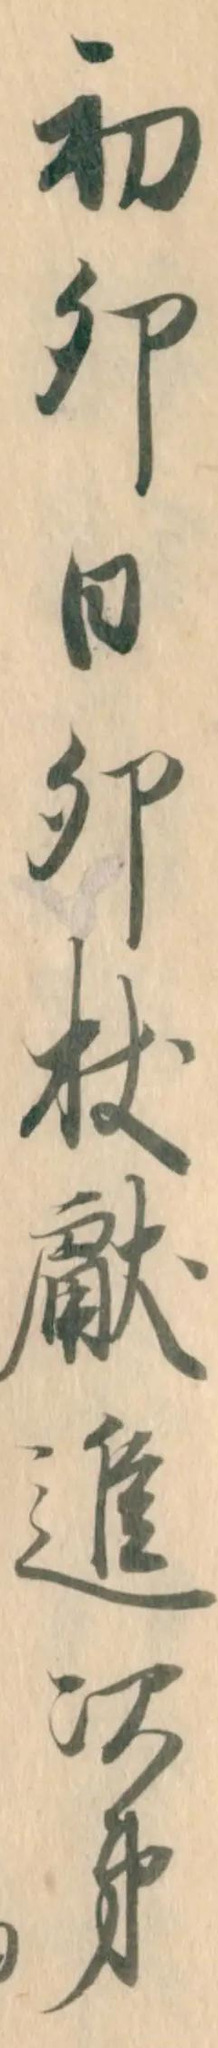初卯日卯杖献進次第

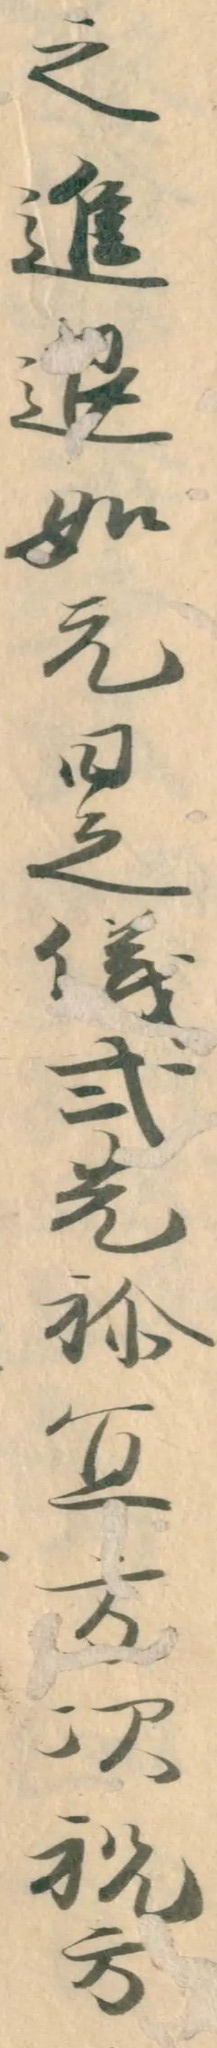之進退如元日之儀式先禰宜方次祝方
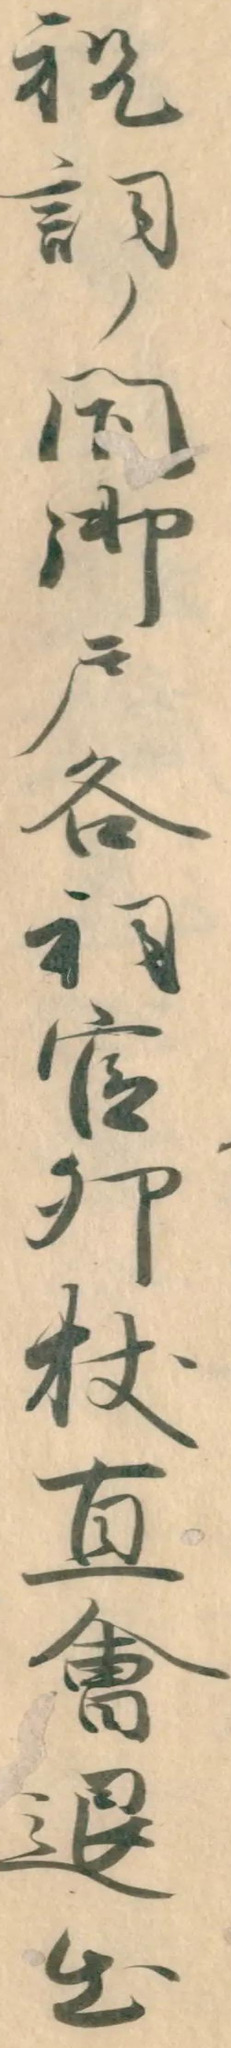祝詞の閇御戸各祠官卯杖直会退出
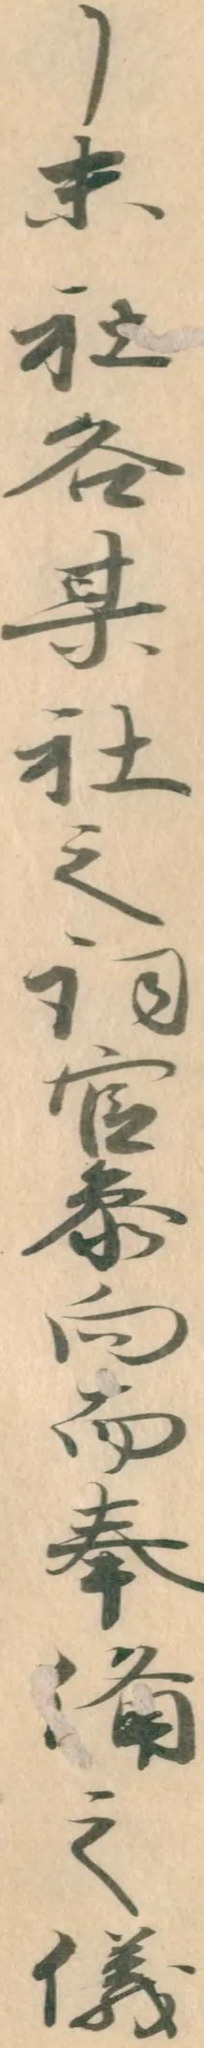し末社各某社之詞官参向而奉備之儀
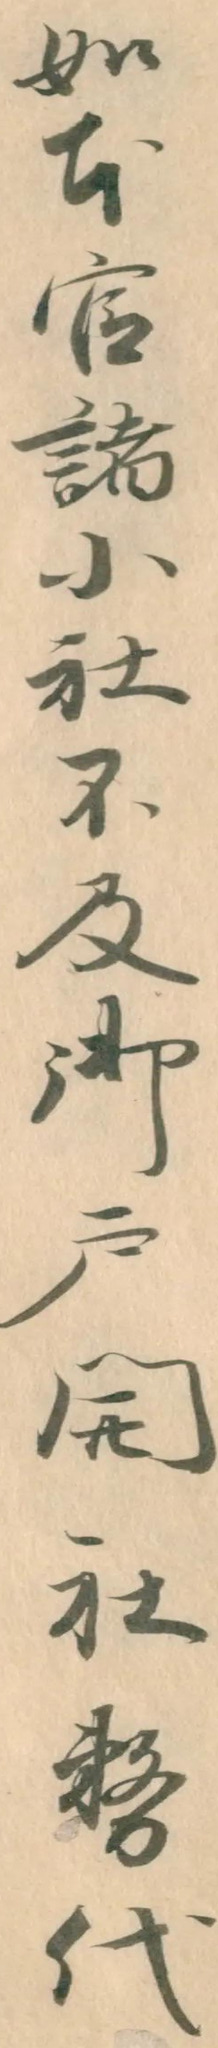如本官諸小社不及御戸開社務代
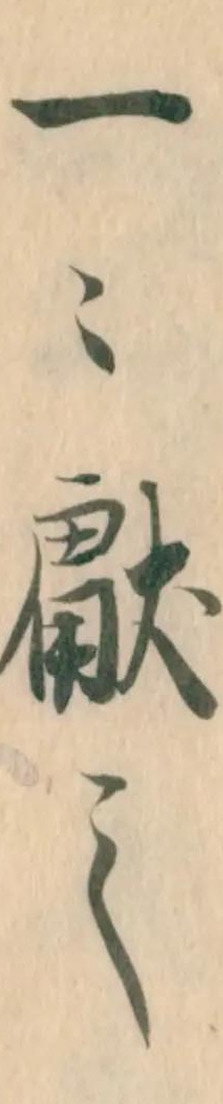一々献之
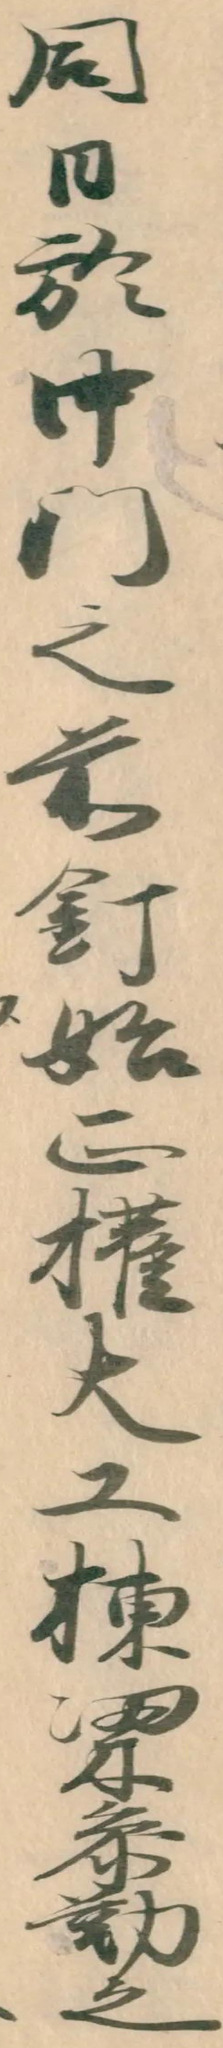同日於中門之前釘始正権大工棟梁参勤之
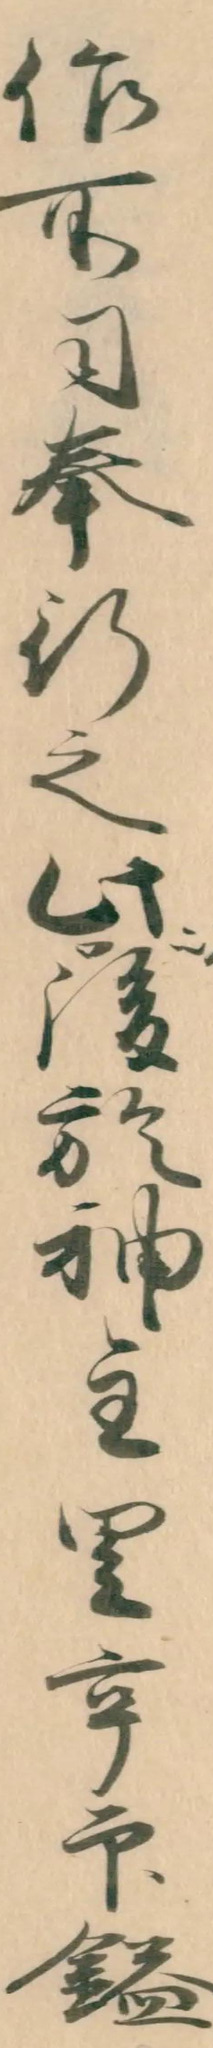作所司奉行之此◦後於神主里亭印鎰
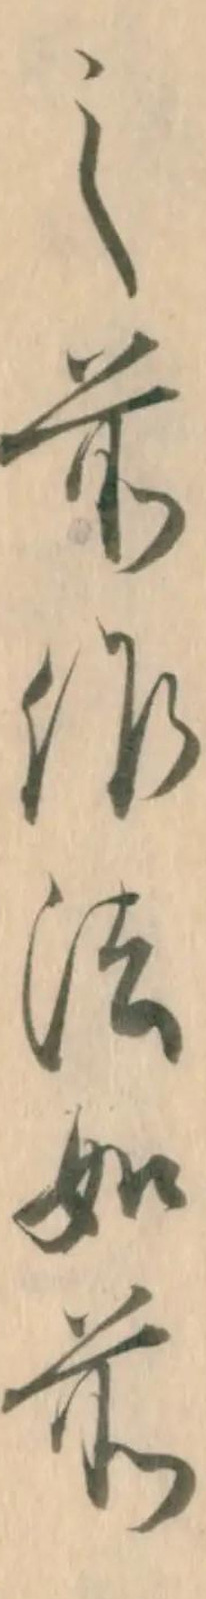之前作法如前
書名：賀茂太神宮年中神事略次第
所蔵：国立国会図書館 National Diet Library, JAPAN
